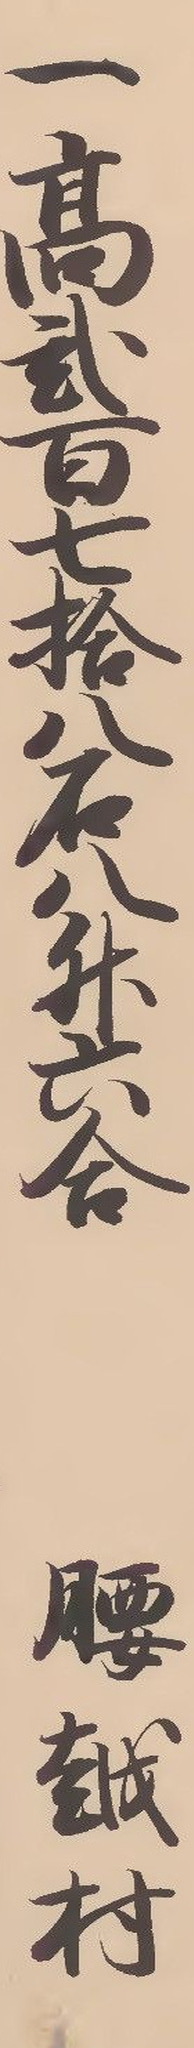一高弐百七拾八石八斗六合腰越村
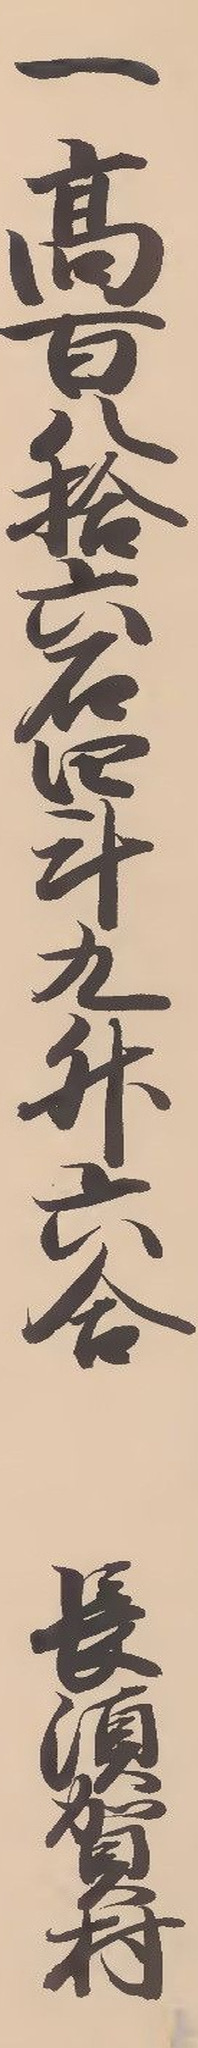一高百八拾六石四斗九升六合長須賀村
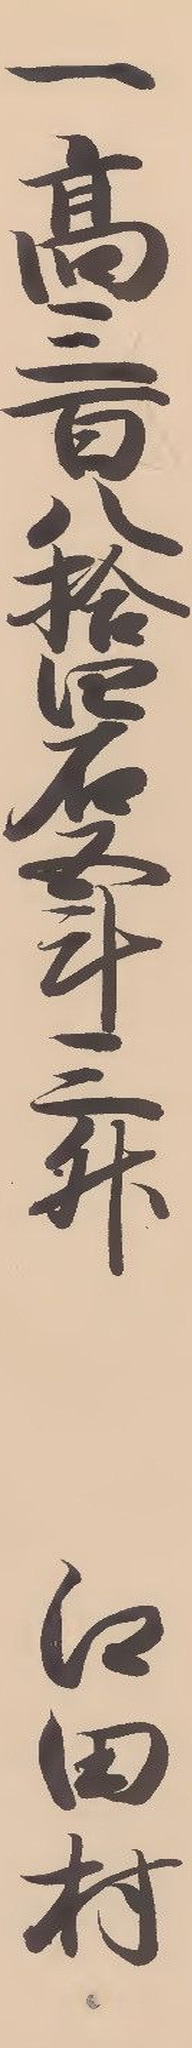一高三百八拾四石五斗三升江田村
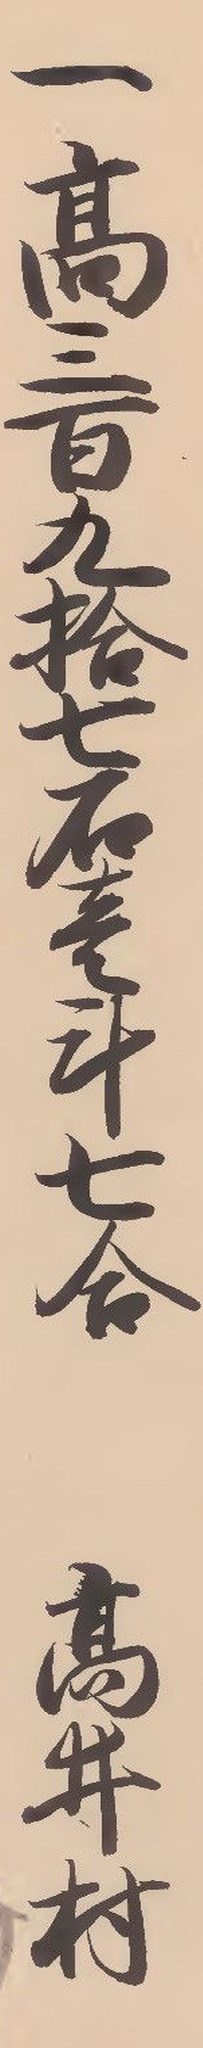一高三百九拾七石壱斗七合高井村
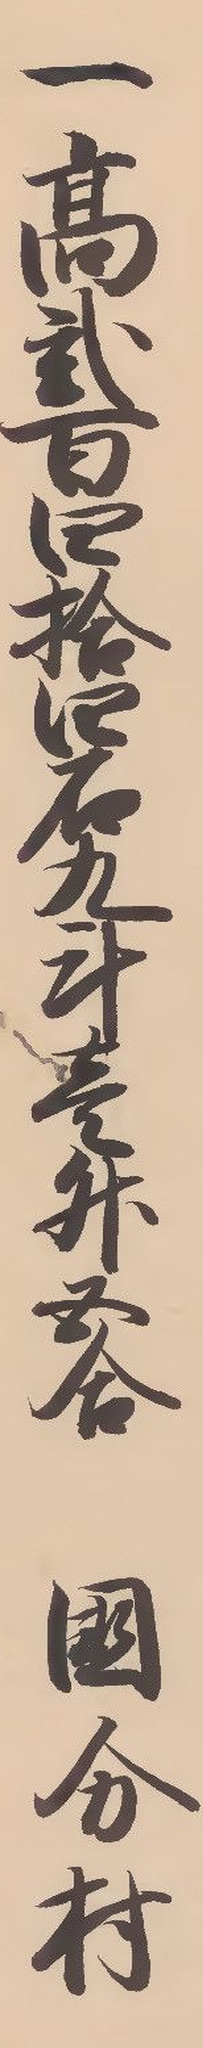一高弐百四拾四石九斗壱升五合国分村

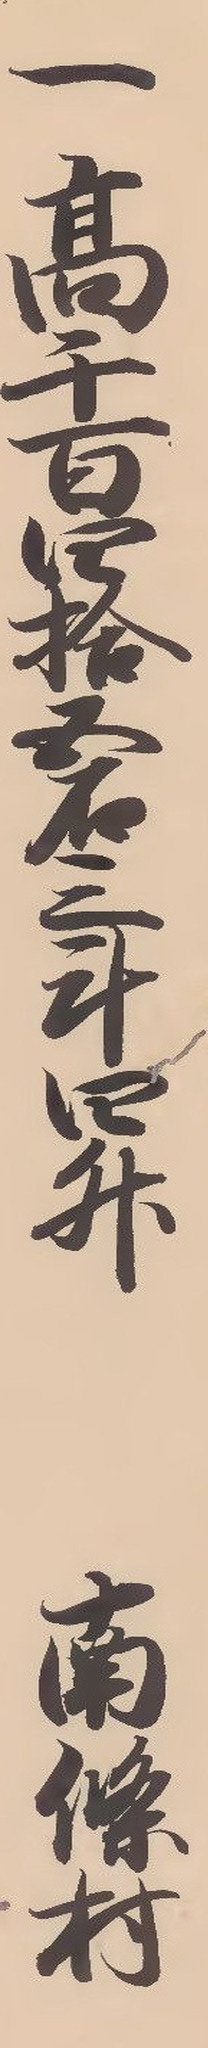一高千百四拾五石三斗四升南条村
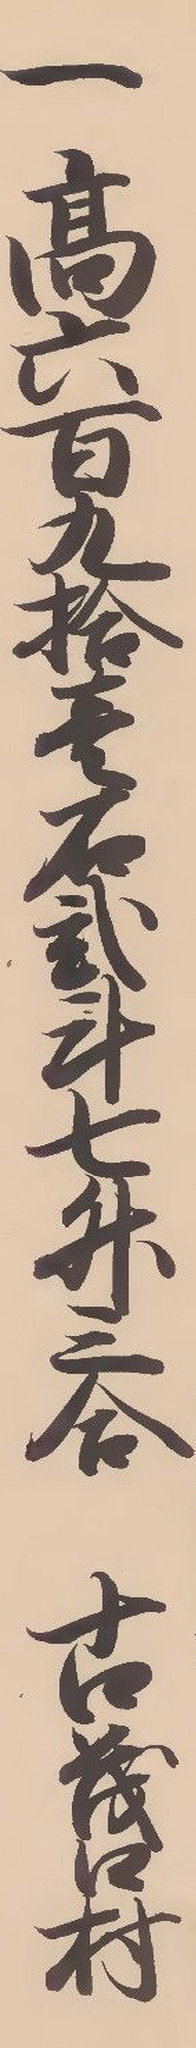一高六百九拾壱石弐斗七升三合古茂口村
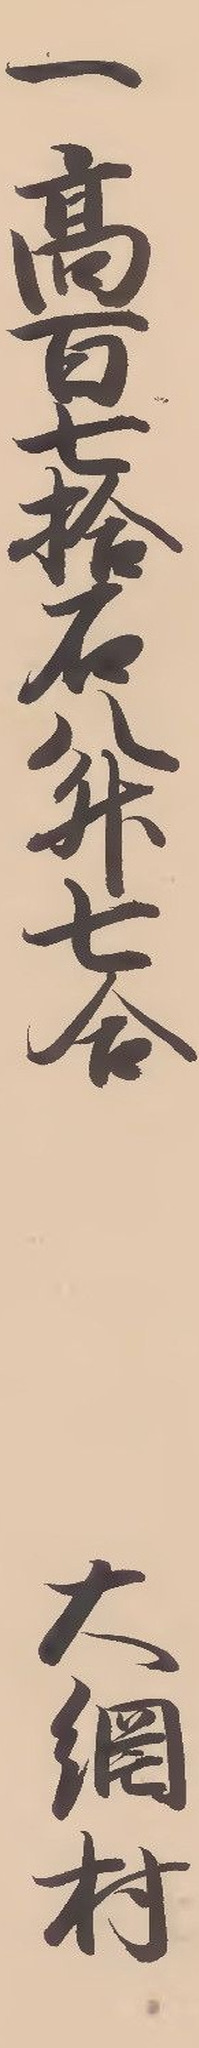一高百七拾石八升七合大網村
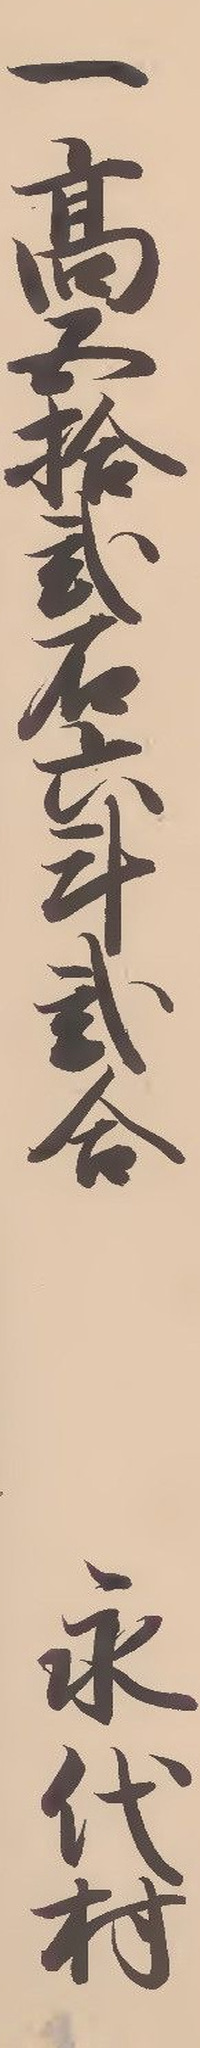一高五拾弐石六斗弐合永代村
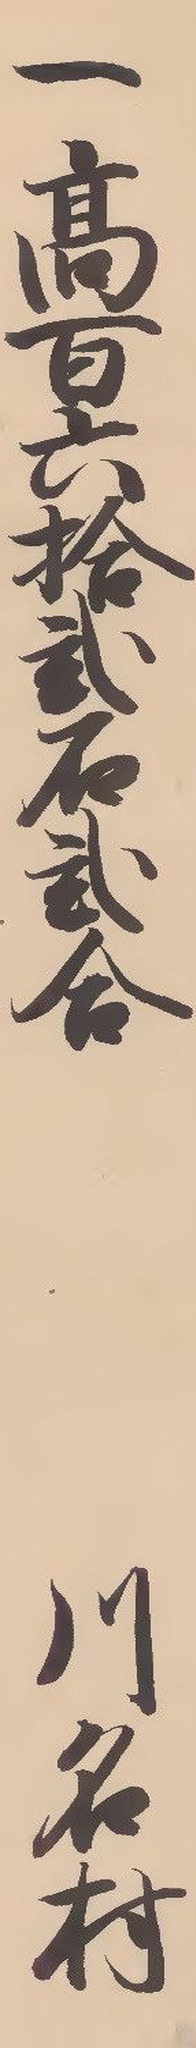一高百六拾弐石弐合川名村
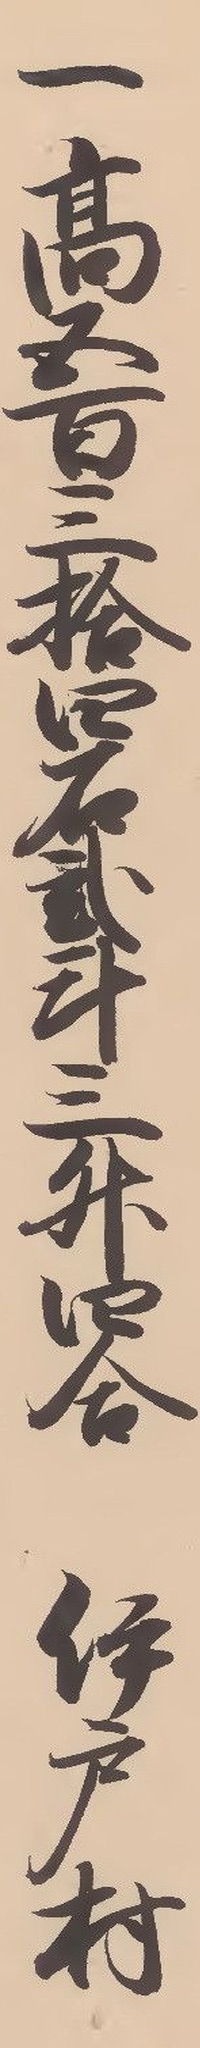一高五百三拾四石弐斗三升四合伊戸村
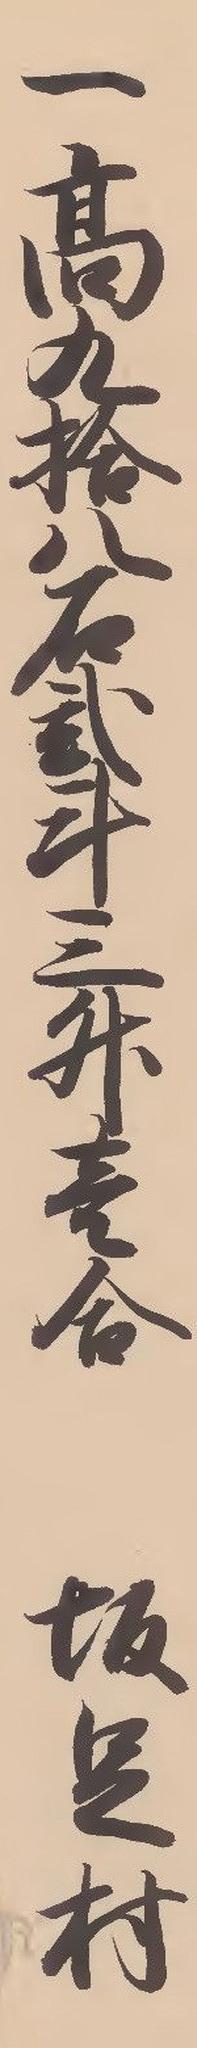一高九拾八石弐斗三升壱合坂足村
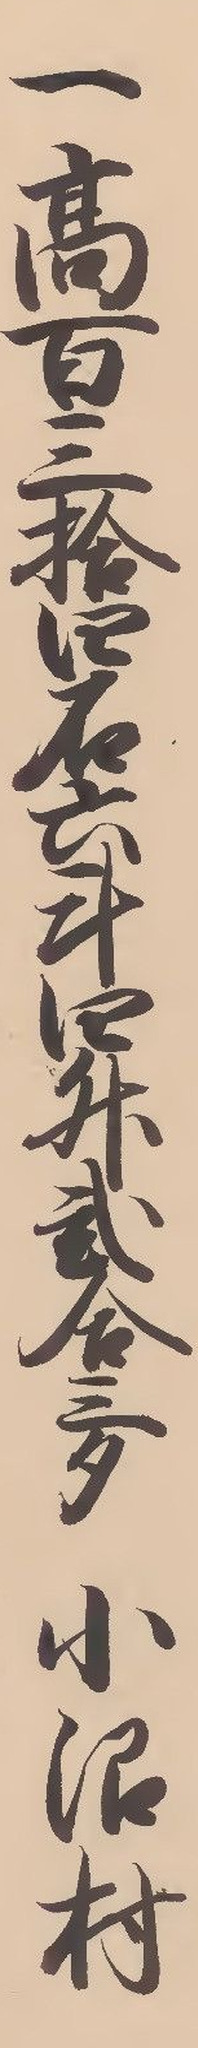一高百三拾四石六斗四升弐合三勺小沼村

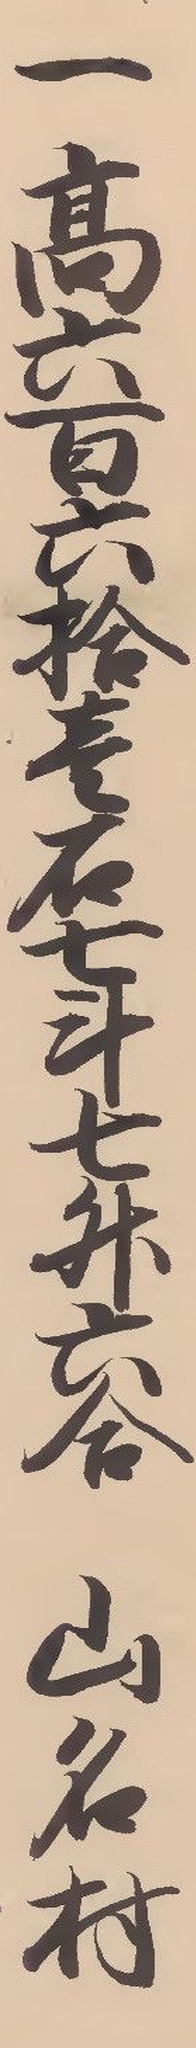一高六百六拾壱石七斗七升六合山名村
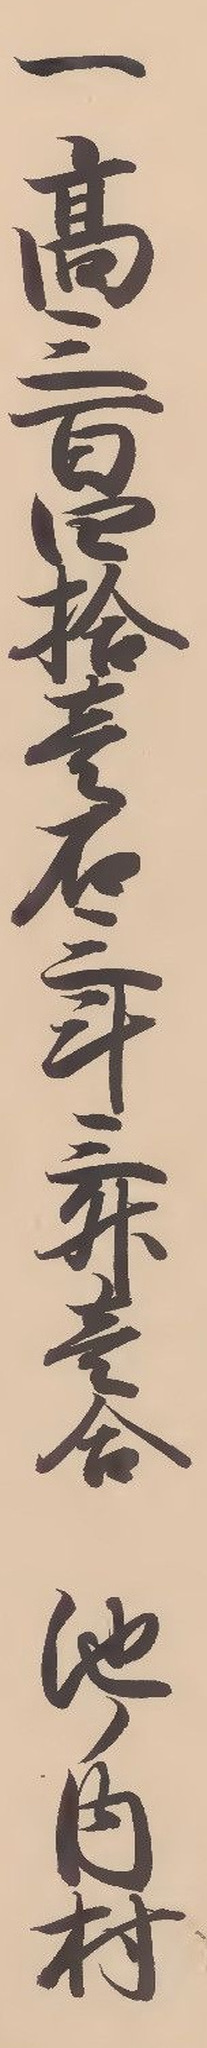一高三百四拾壱石三斗三升壱合池ノ内村
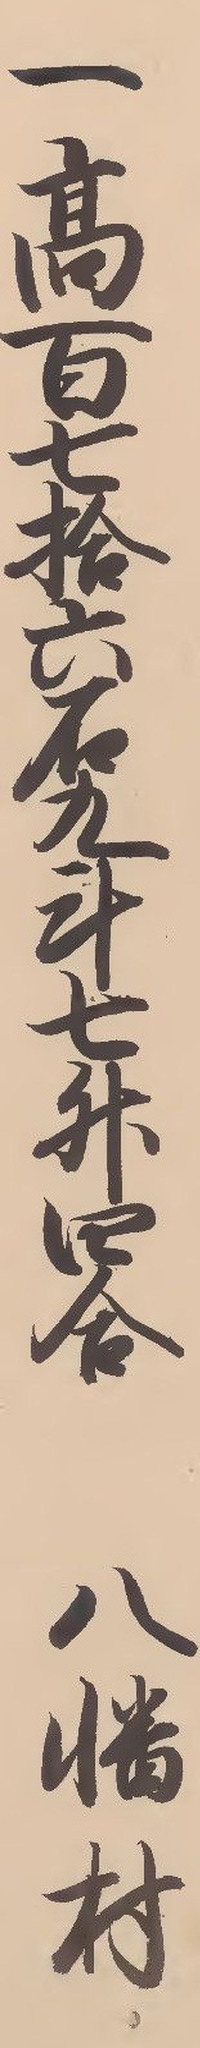一高百七拾六石九斗七升四合八幡村
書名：安房国郷帳
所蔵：国立公文書館 National Archives of Japan
